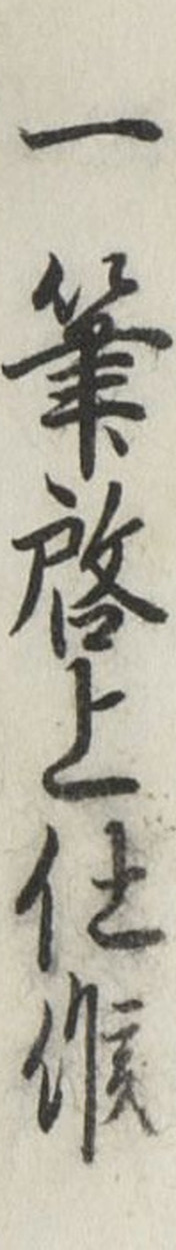一筆啓上仕候
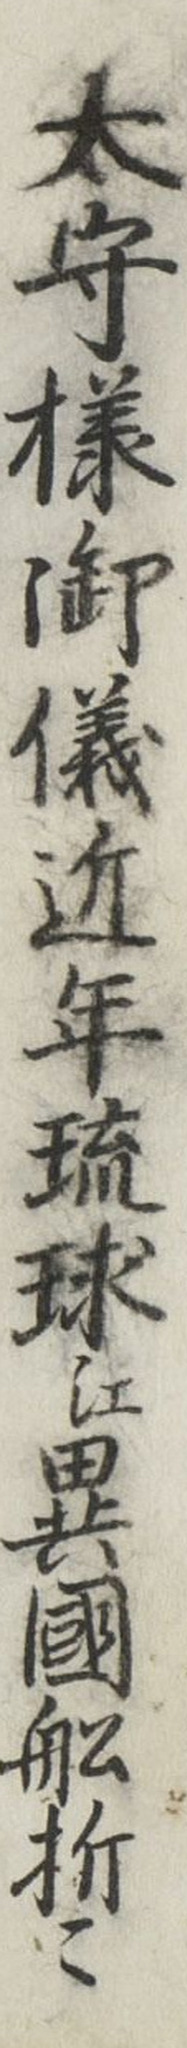太守様御儀近年琉球江異国船折々
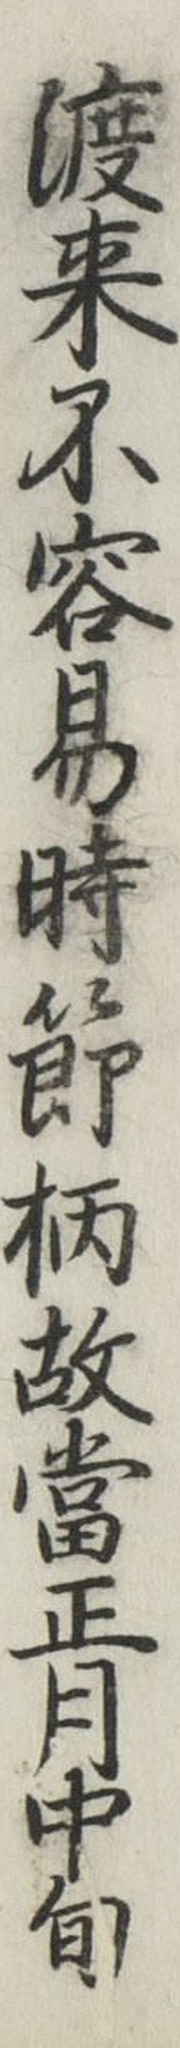渡来不容易時節柄故當正月中旬
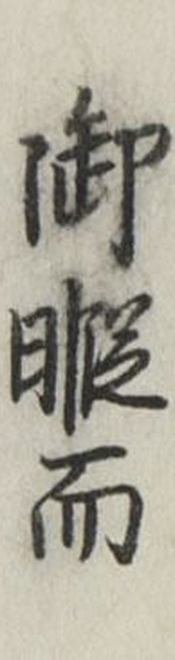御暇而
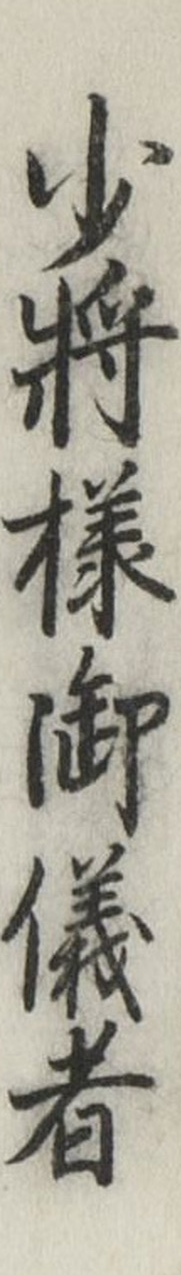少将様御儀者
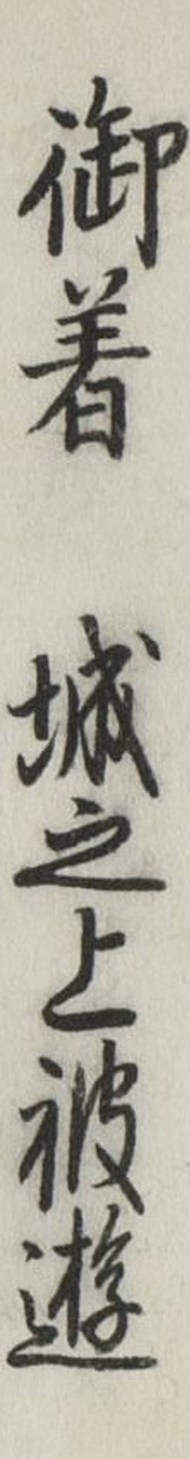御着城之上被遊
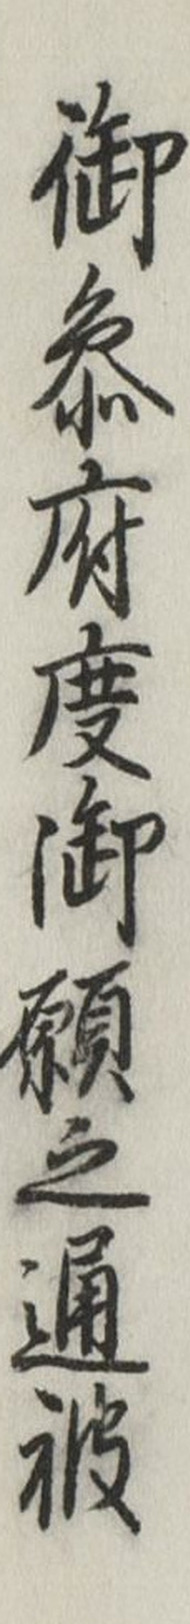御参府度御願之通被
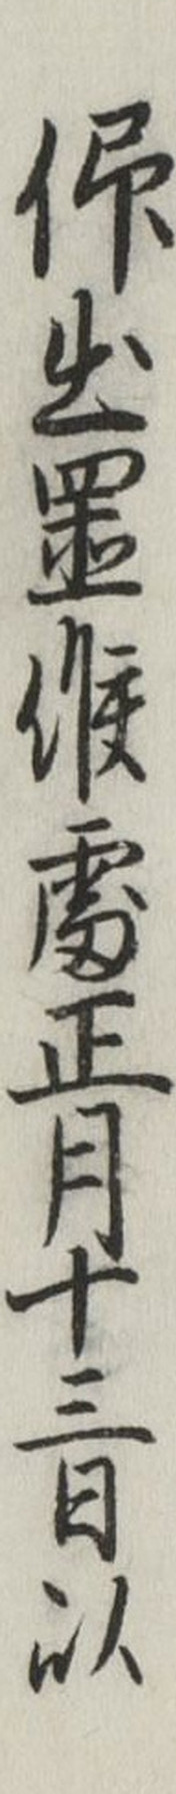仰出置候處正月十三日以
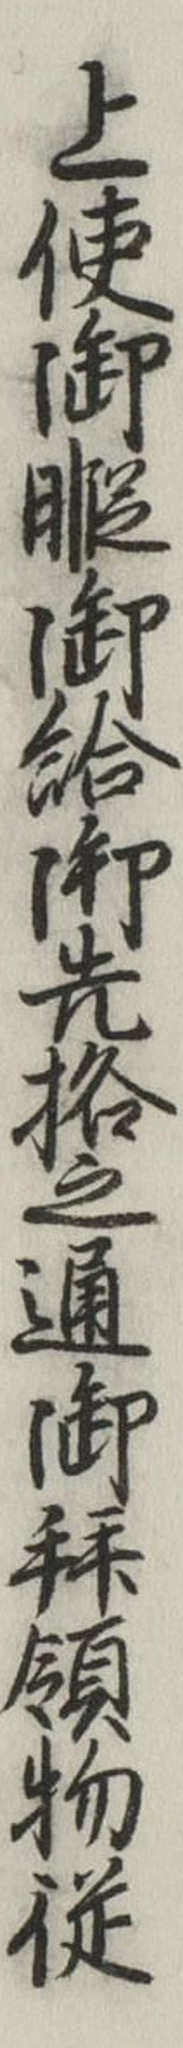上使御暇御給御先格之通御拝領物従
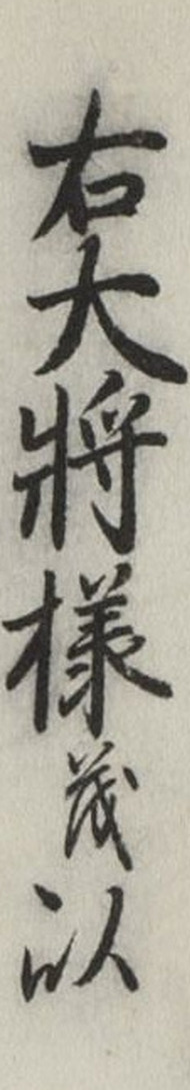右大将様茂以
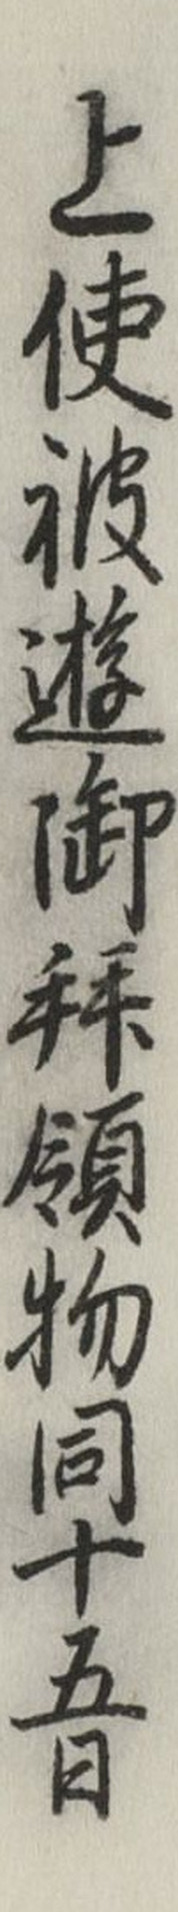上使被遊御拝領物同十五日
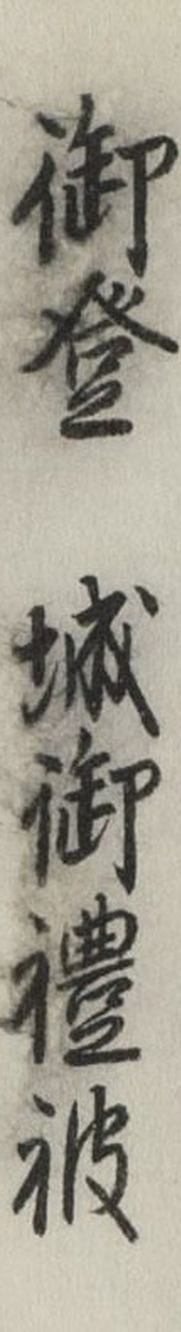御登城御礼被
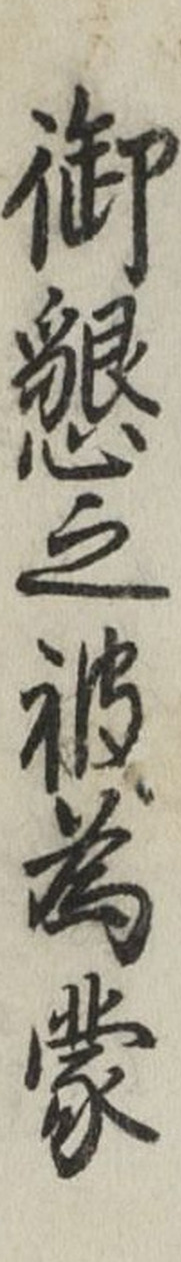御懇之被為蒙
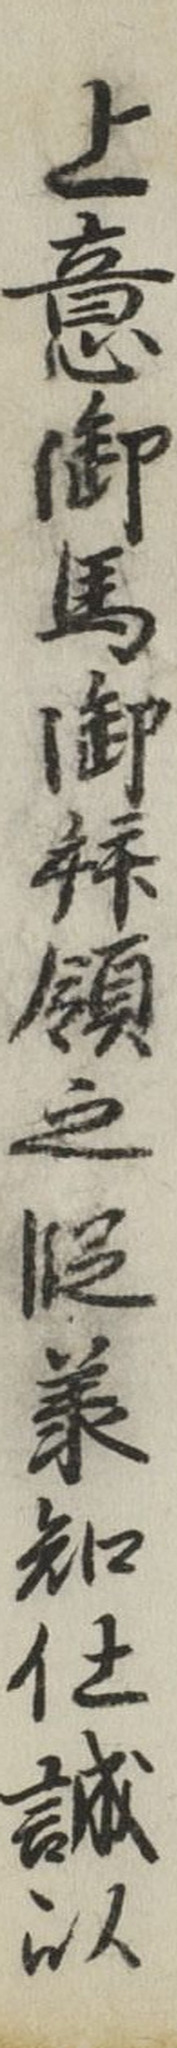上意御馬御拝領之段承知仕誠以
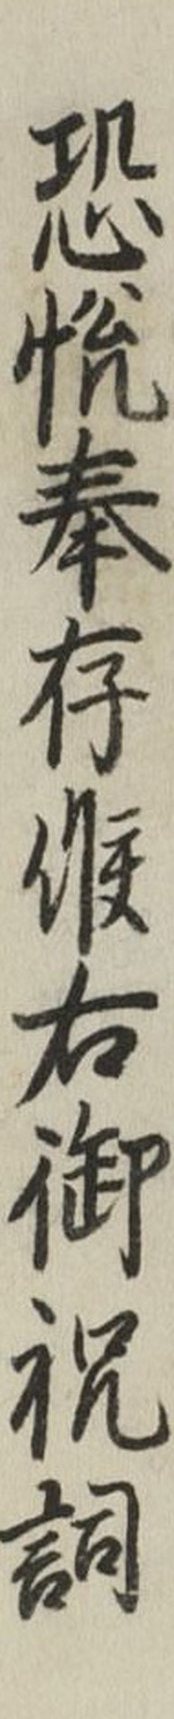恐悦奉存候右御祝詞
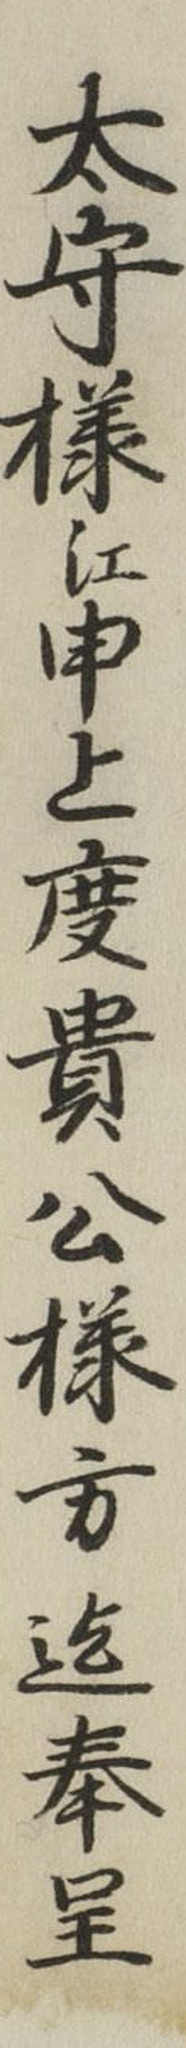太守様江申上度貴公様方迄奉呈
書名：島津家宛花押印状(三) 與那原親方 良綱
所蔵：University of the Ryukyus Library
